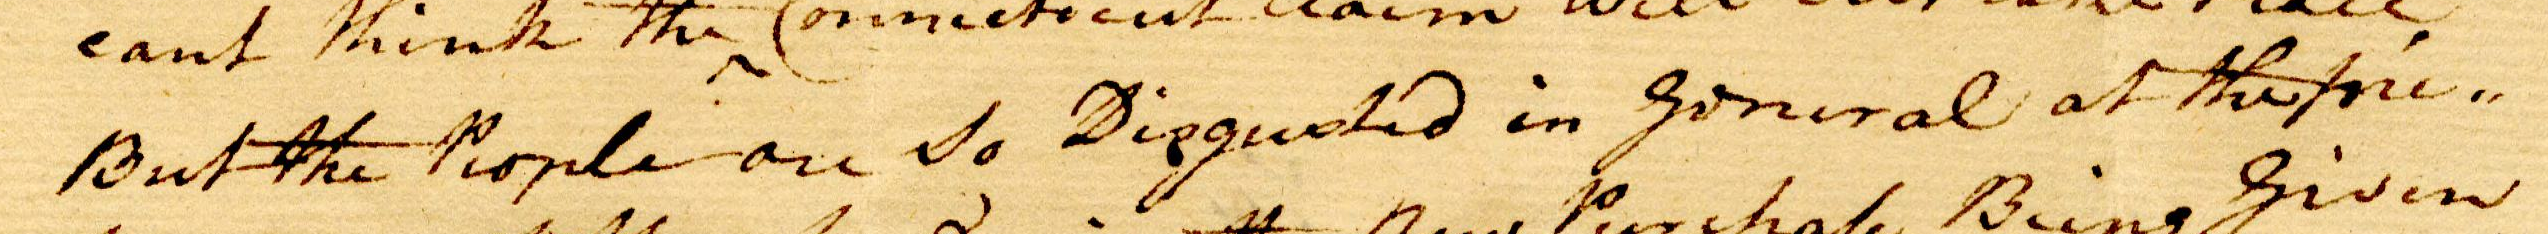But the People are so Disgusted in general at the pre-
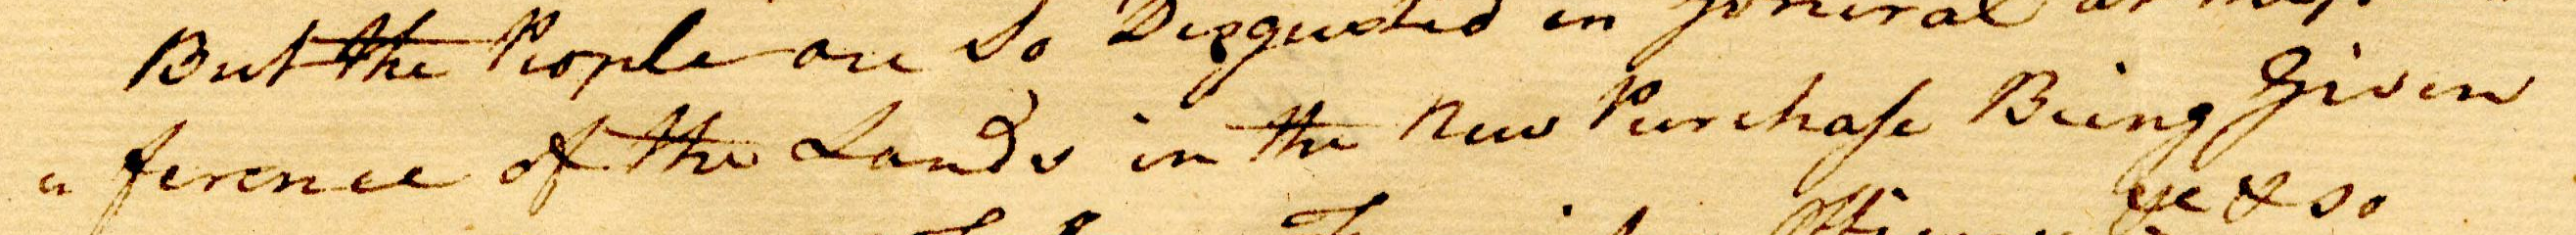-ference of the Lands in the new Purchase Being given
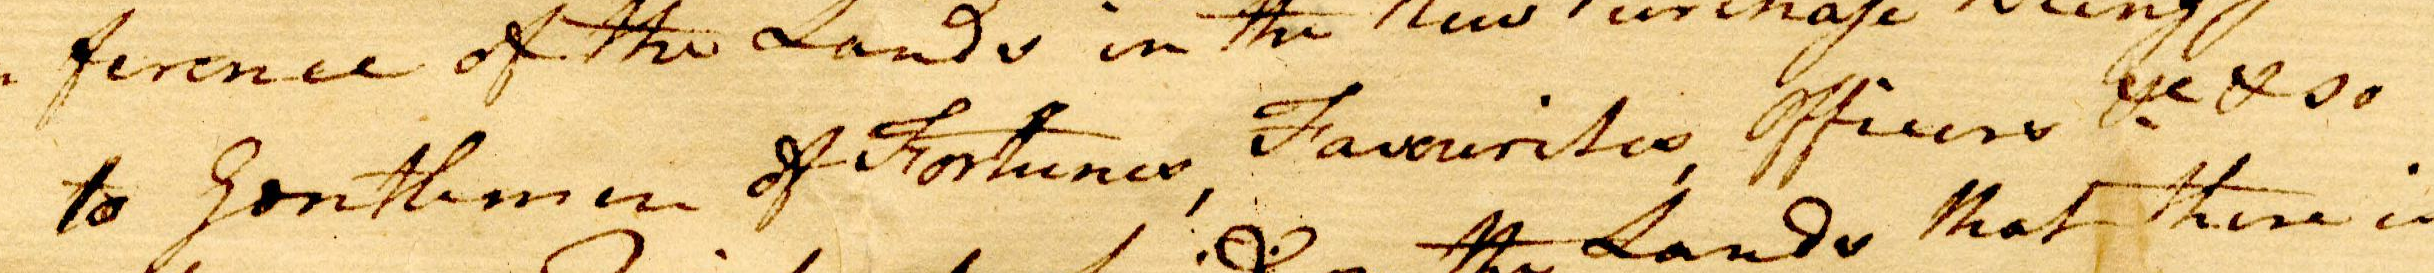to gentlemen of Fortunes, Favorites, Officers &^c. & so
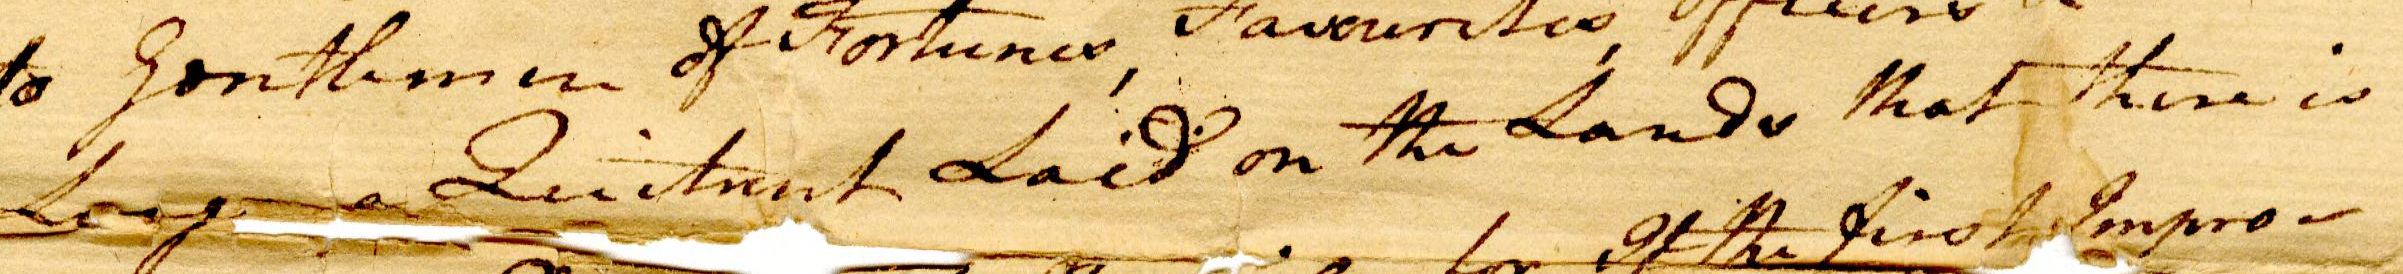Long a Quitrent Laid on the Lands that there is
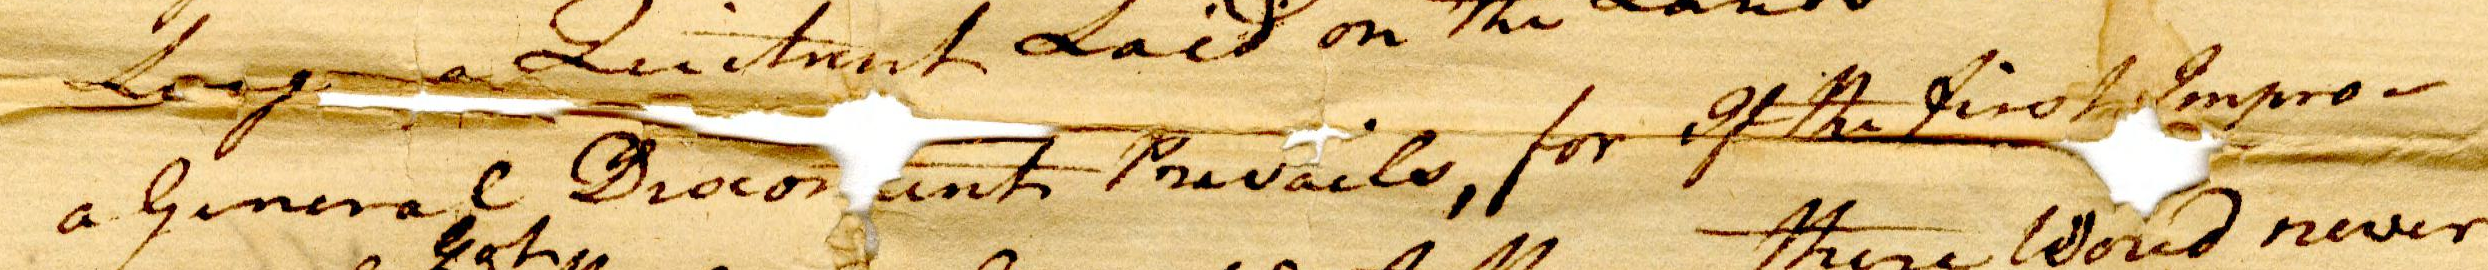a General Discontent Prevails, for If the first Impro-
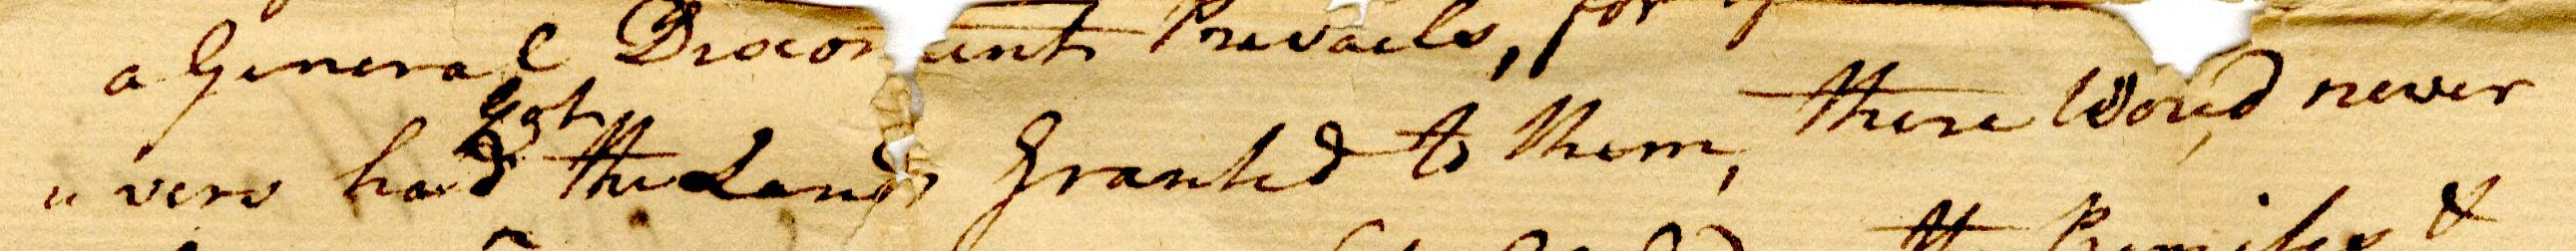-vers had ^got the Lands granted to them, there woud never
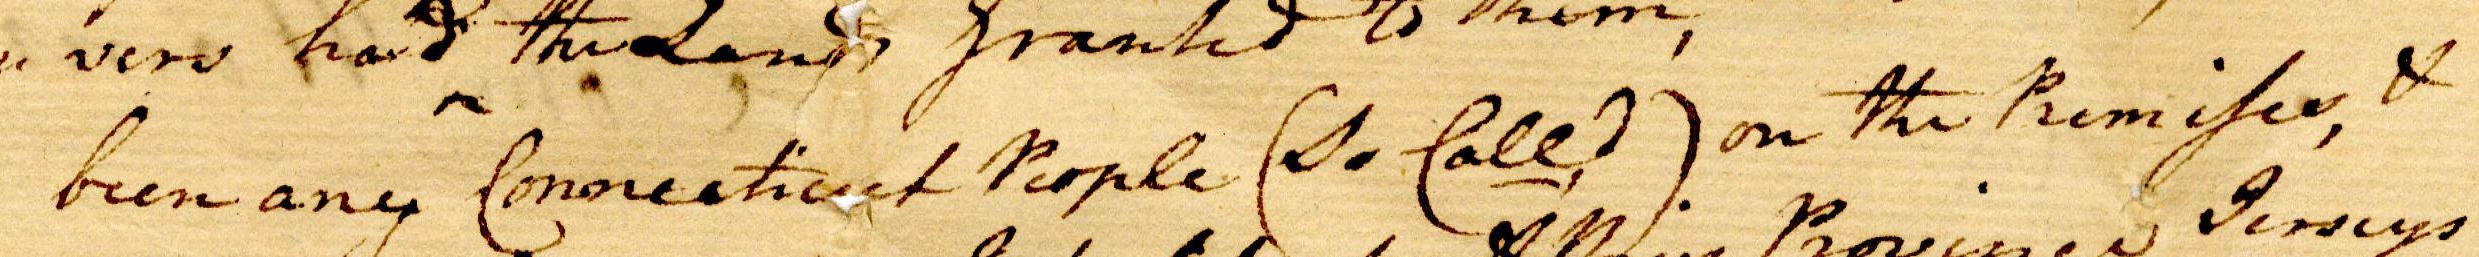been any Connecticut People (so calld,) on the Premisce, &
